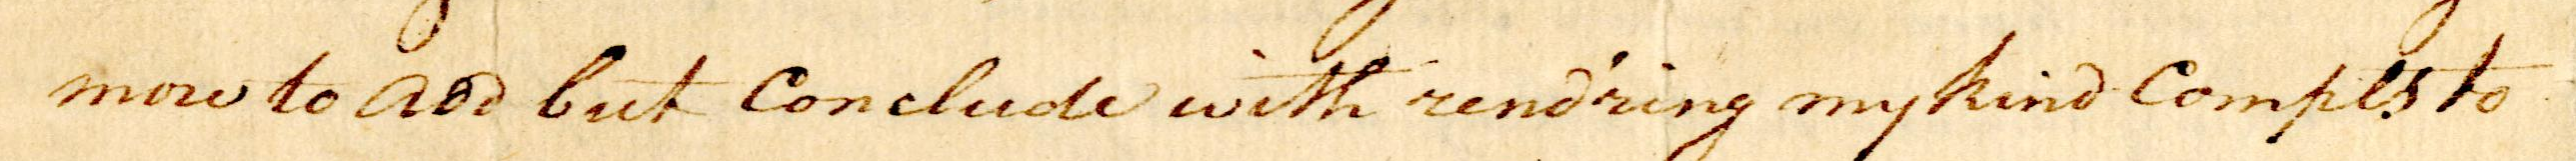more to Add but Conclude with rendring my kind Compts to
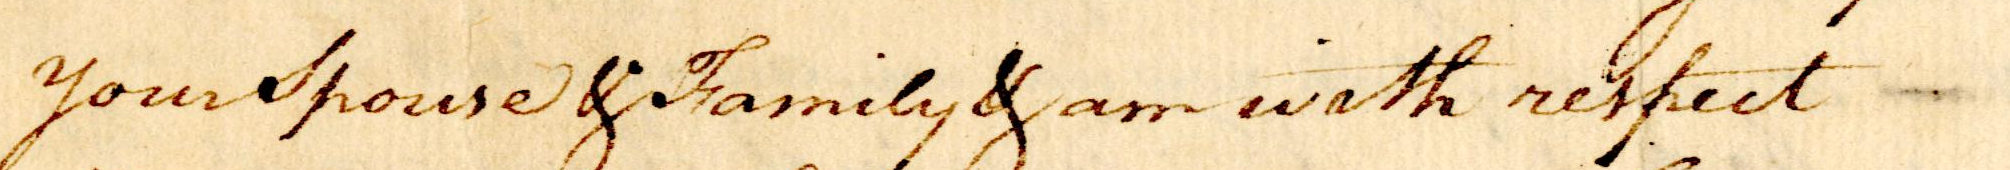Your Spouse & Family & am with respect
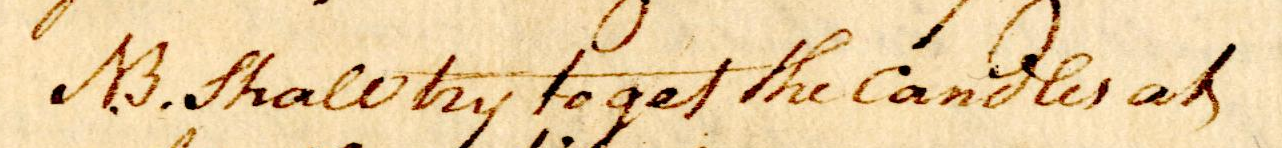NB. Shall try to get the Candles at
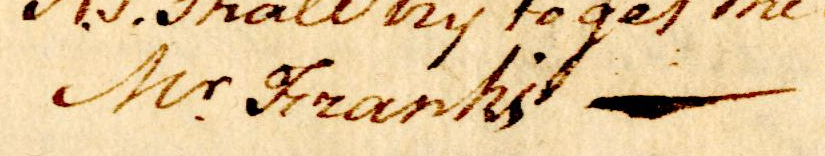M^r Frank's-
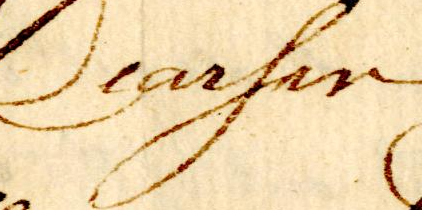Dear Sir
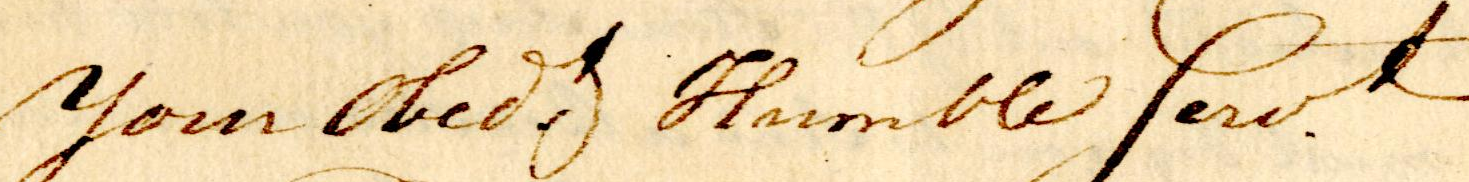You obed^g Humble Serv^t
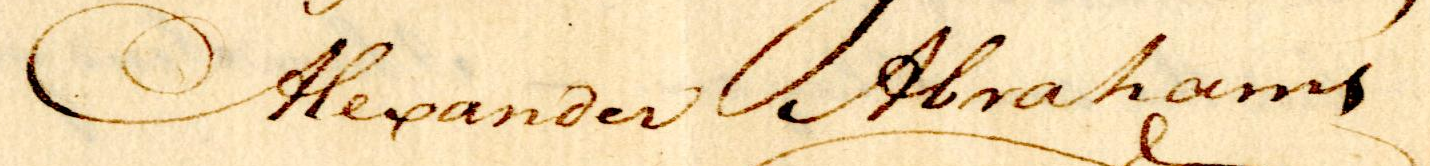Alexander Abraham
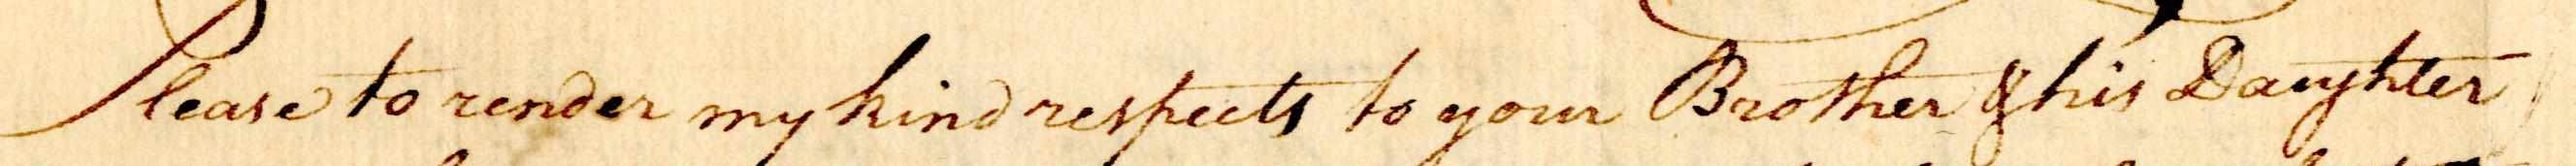Please to render my kind respects to your Brother & his Daughter
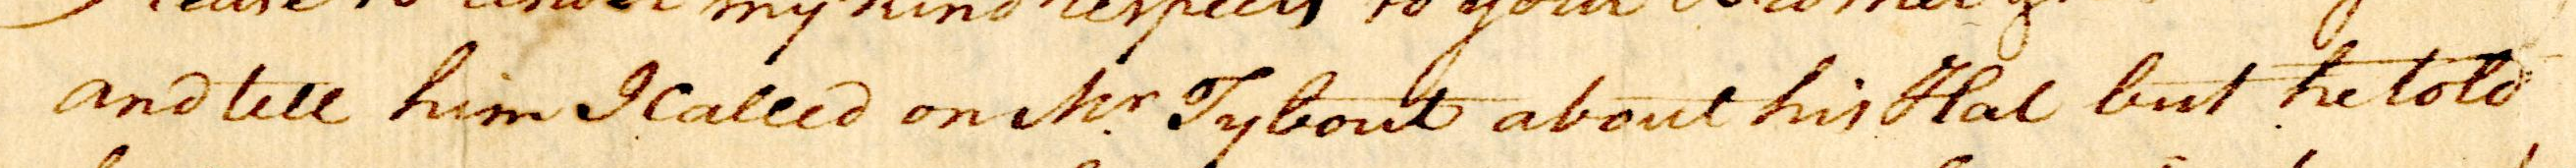and tell him I called on M^r Tybout about his Hal but he told
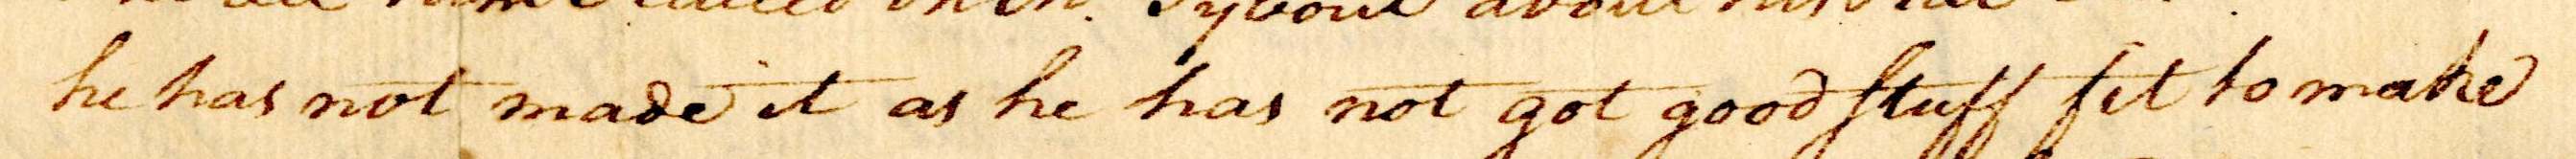he has not made it as he has not got good stuff fit to make
